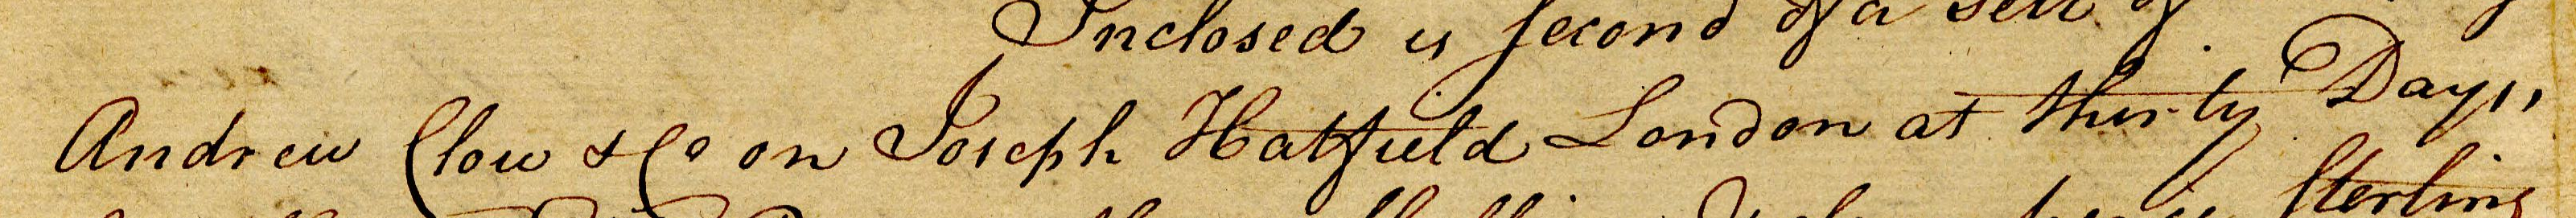Andrew Clow & C^o on Joseph Hatfield London at thirty Days
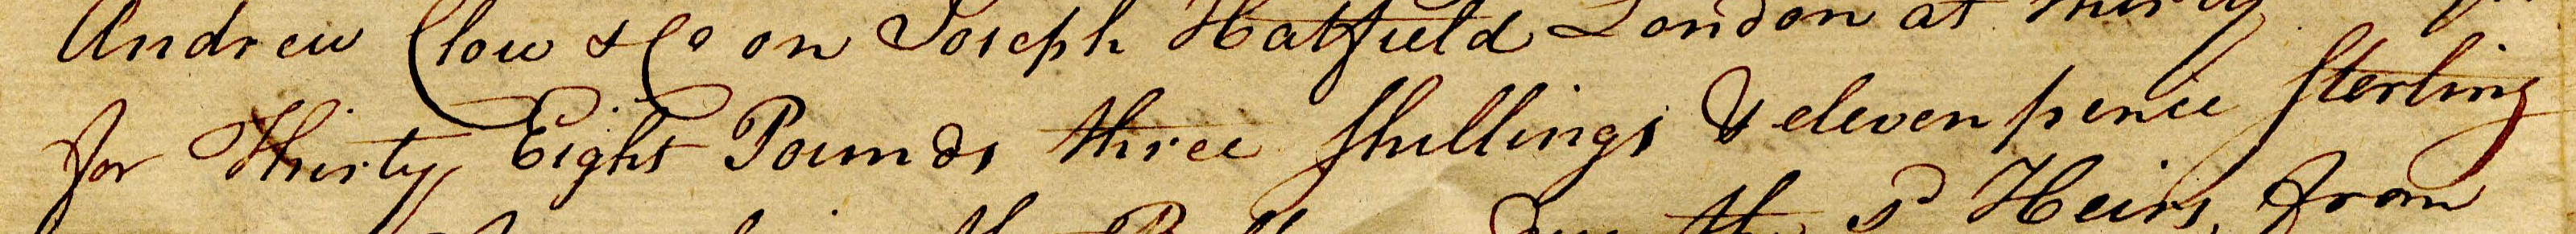for Thirty Eight Pounds three shillings & eleven pence sterling
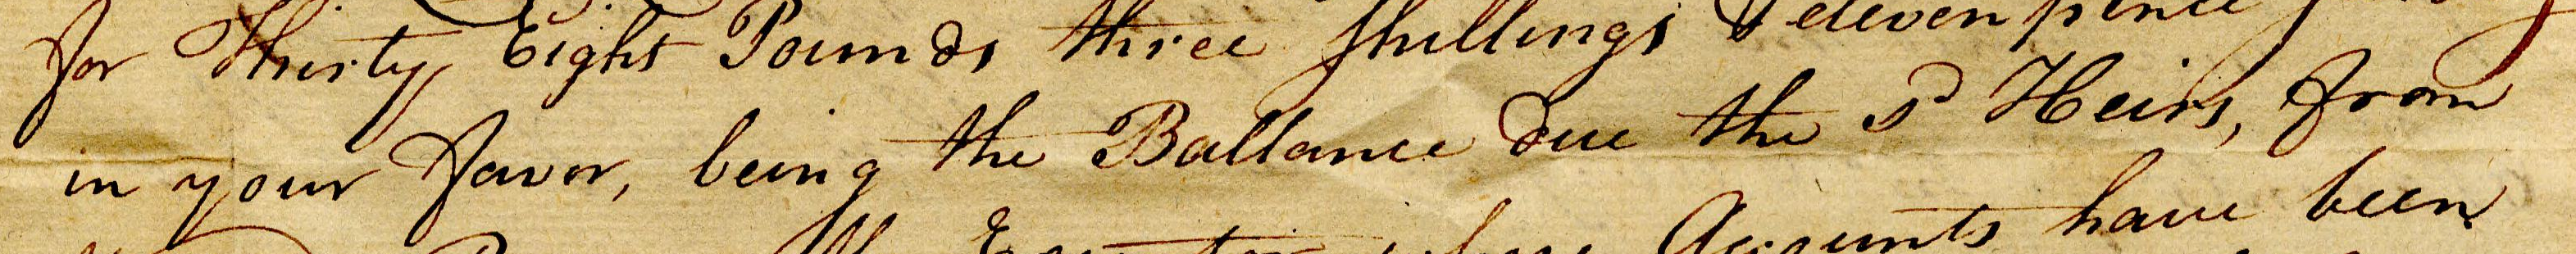in your favor being the Ballance due the s^d Heirs, from
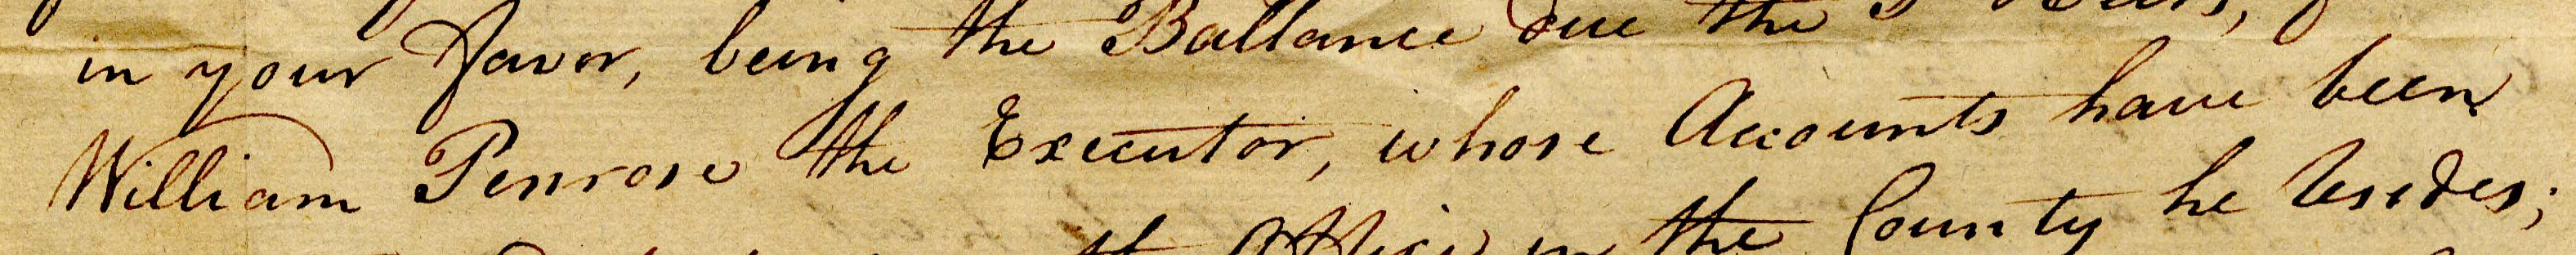William Penrose the Executor, whose Accounts have been
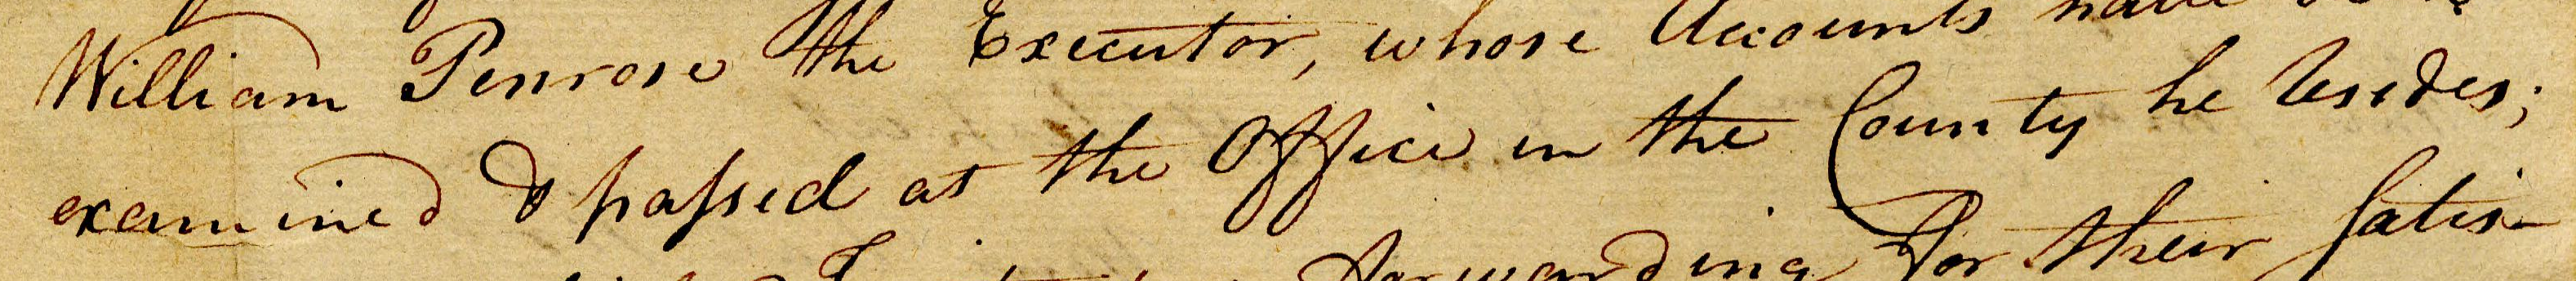examined & passed at the office in the County he resides;
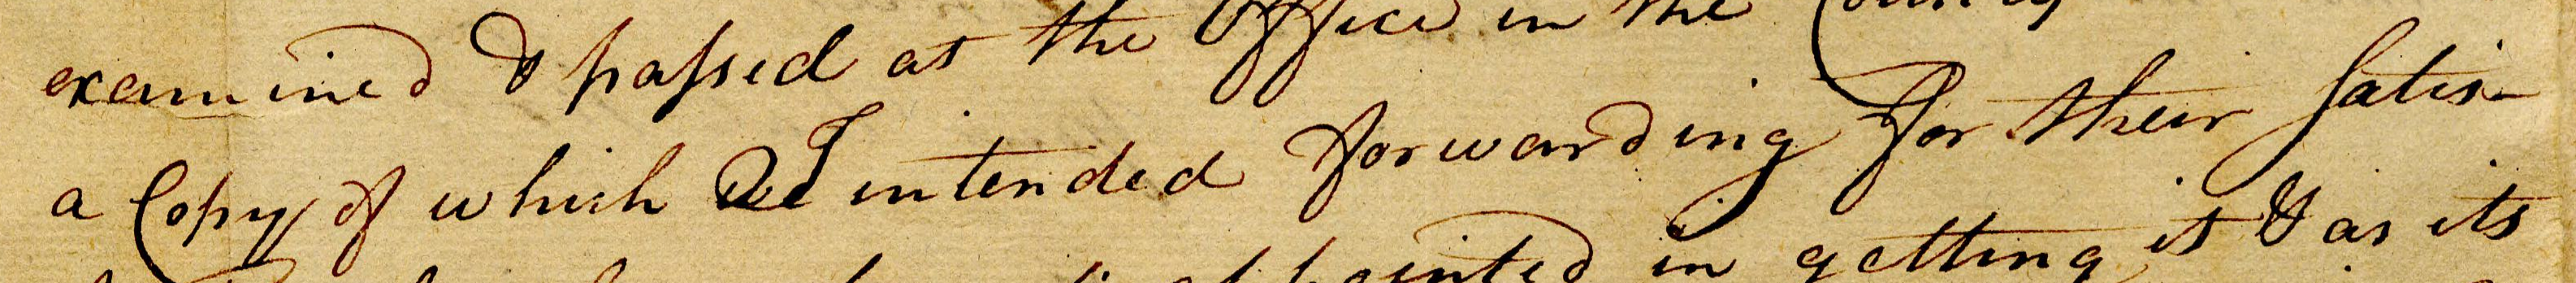a Copy of which I intended forwarding for their satis
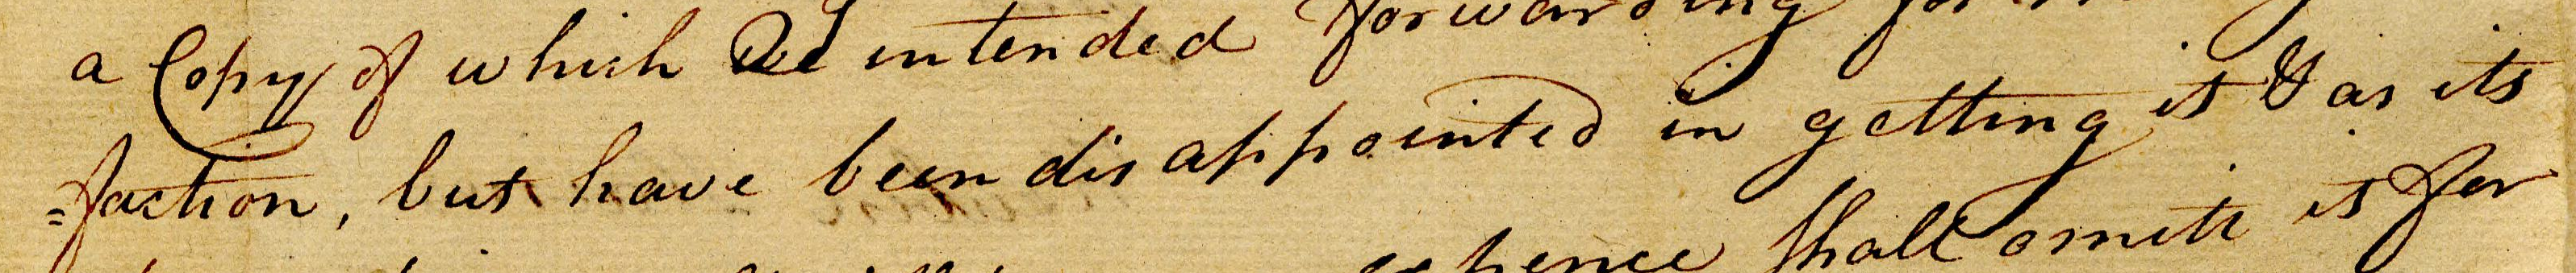-faction, but have been disappointed in getting it & as its
